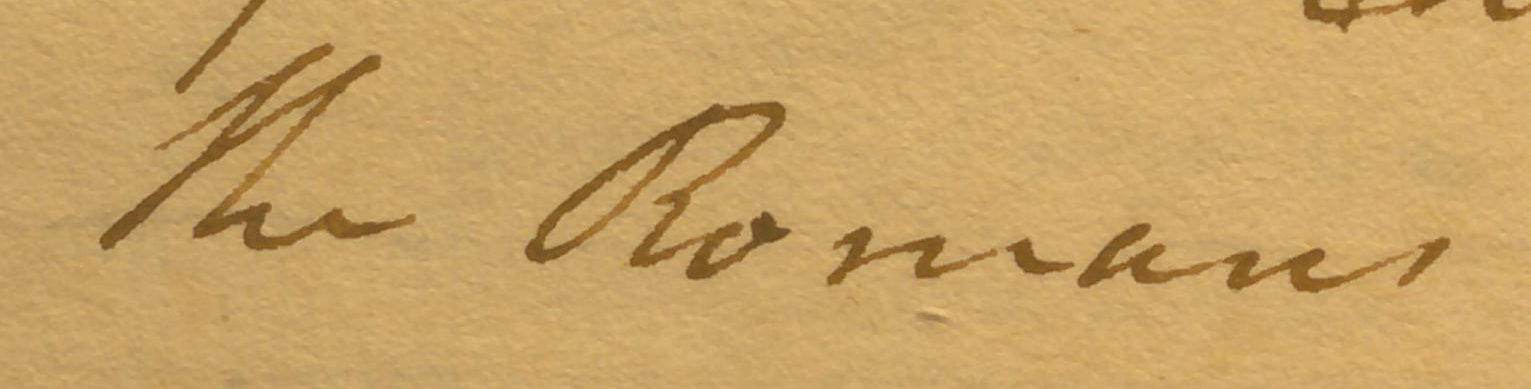the Romans
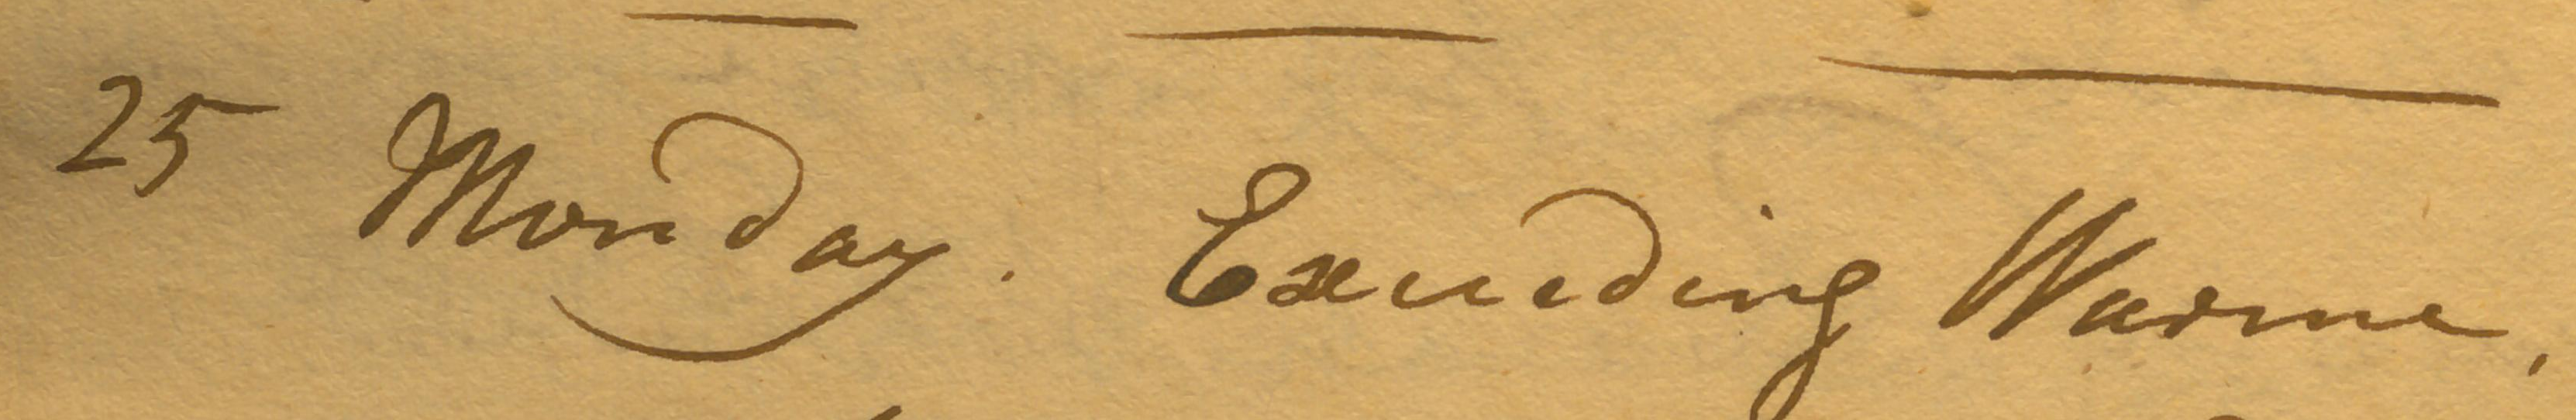25 Monday. Exceeding Warme
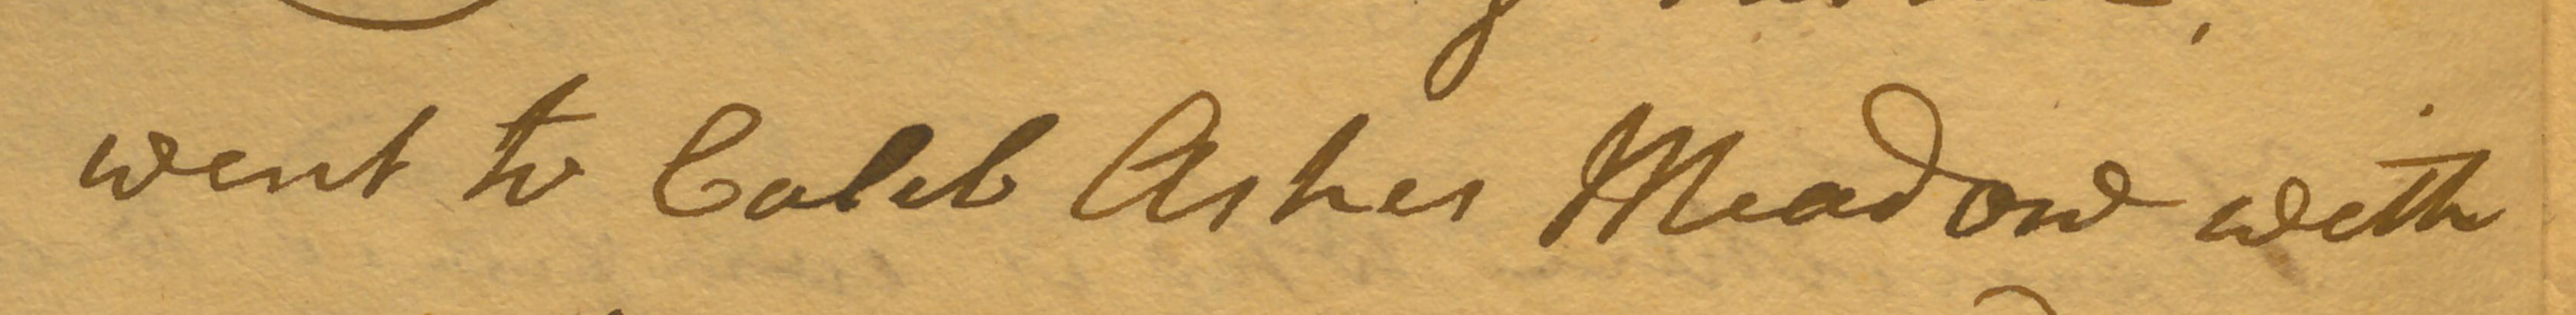went to Caleb Ashes Meadow with
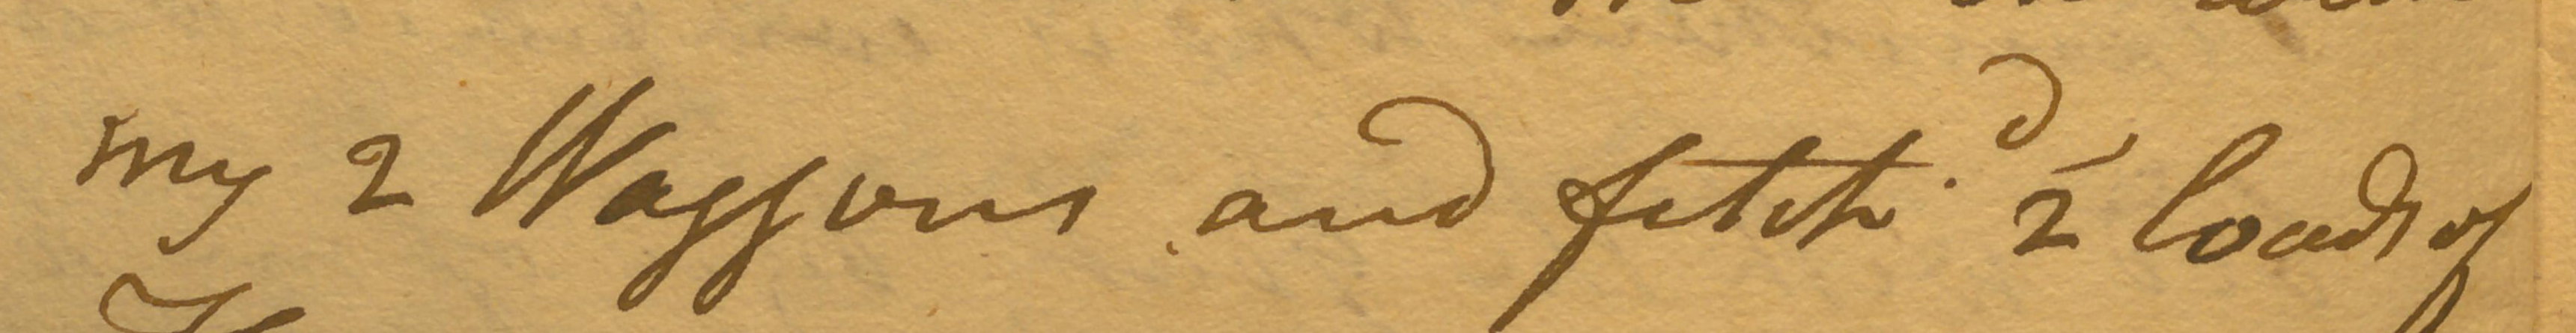my 2 Waggons and fetch^d. 2 loads of
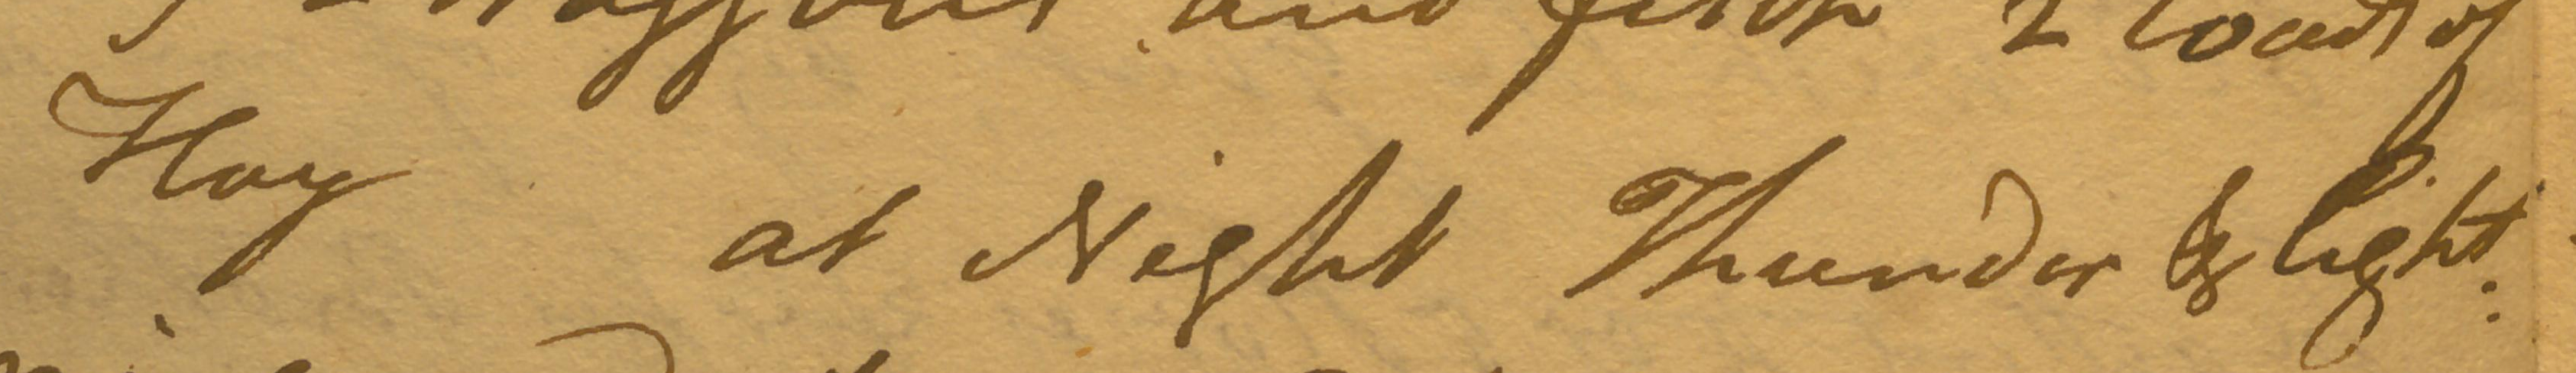Hay at Night Thunder & light:
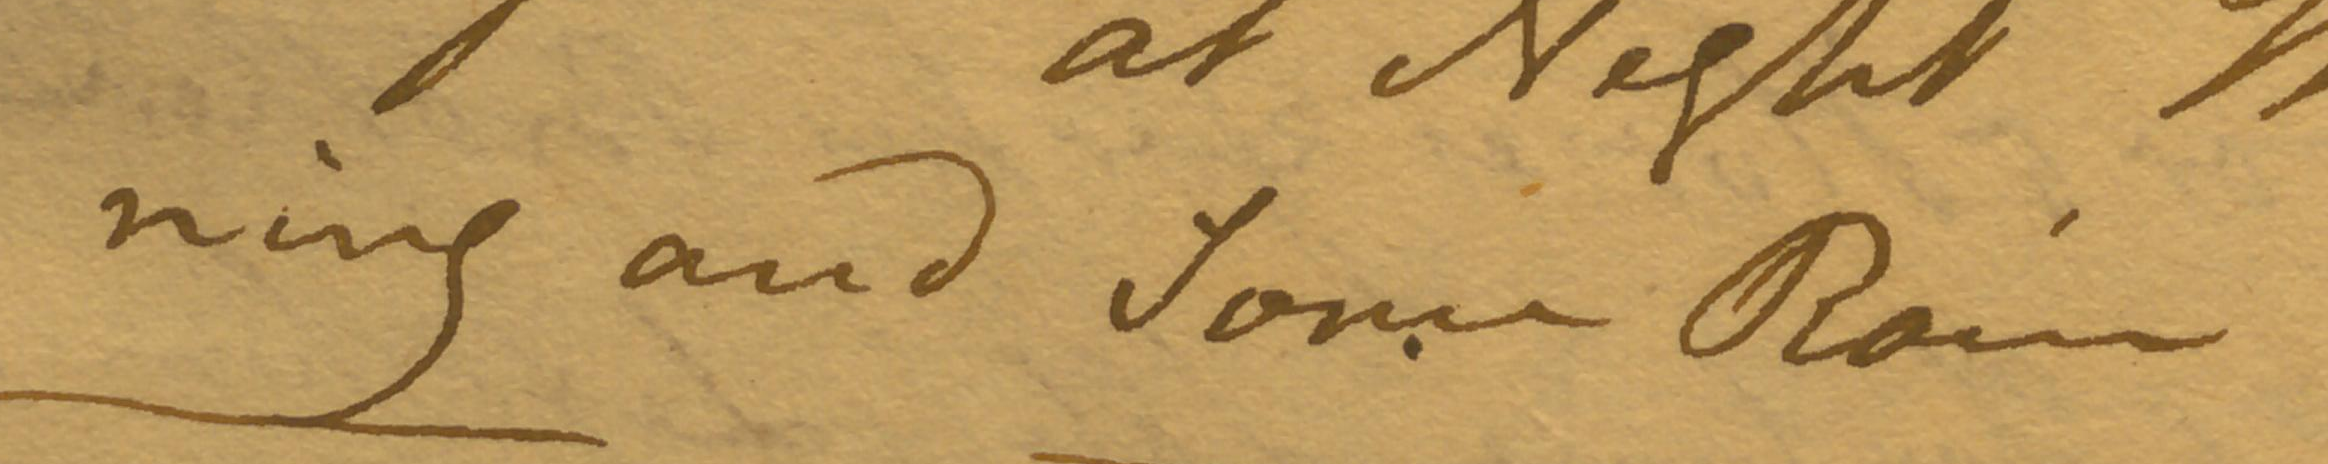ning and some Rain
